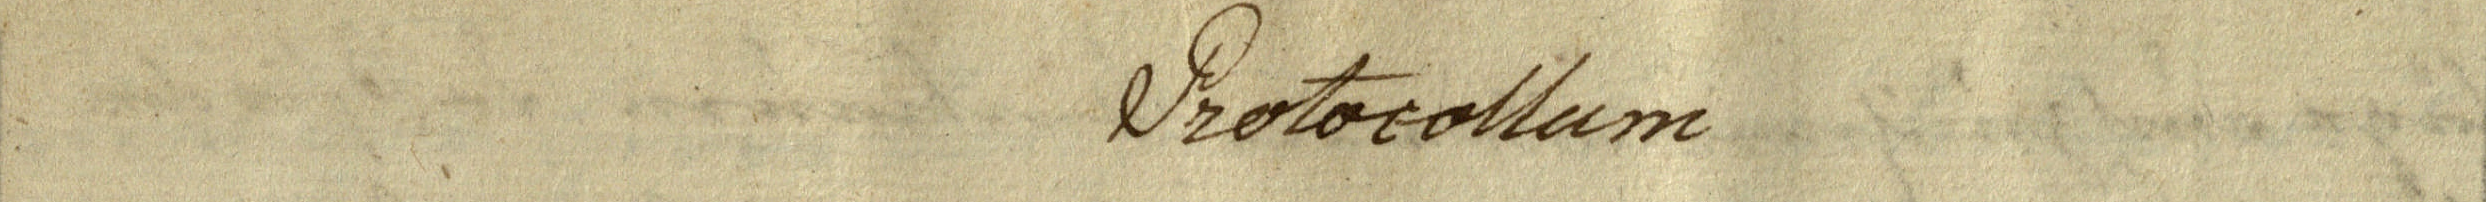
Protocollum
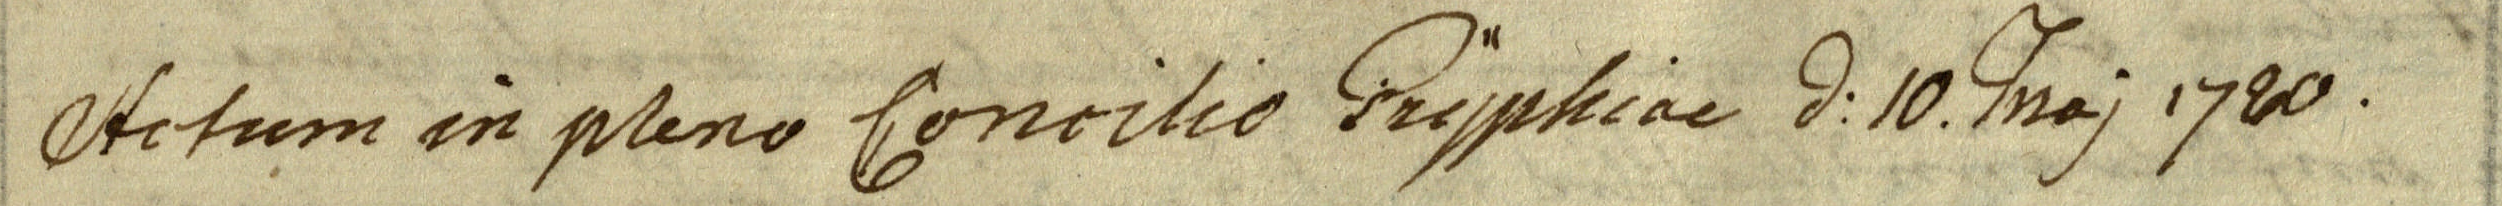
Actum in pleno Concilio Grÿphiae d: 10. Maj 1780.
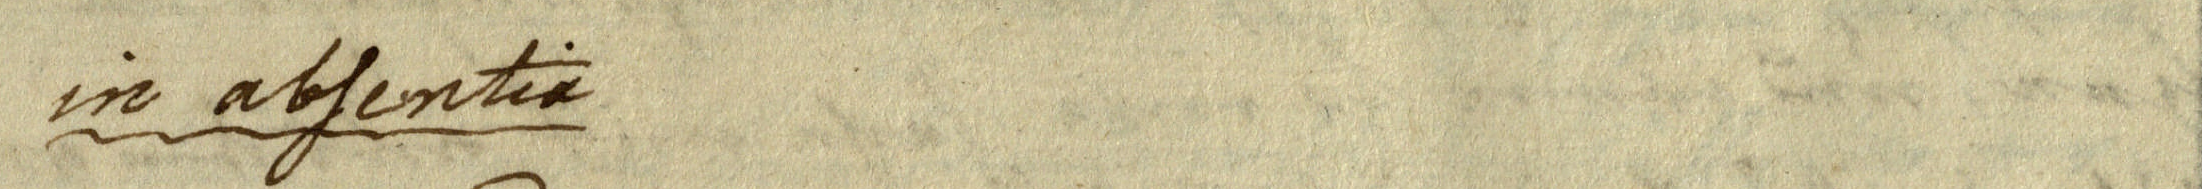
in absentia
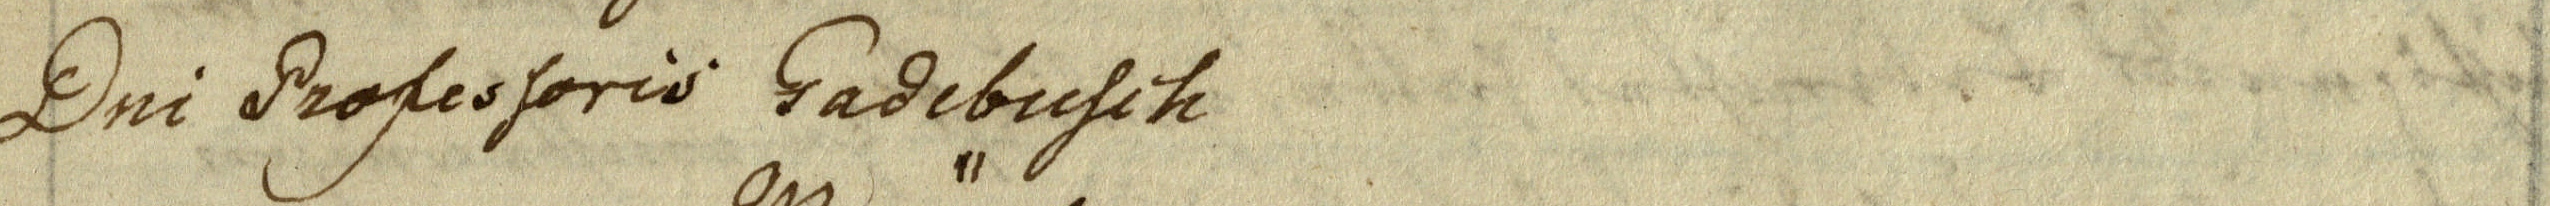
Dni Professoris Gadebusch
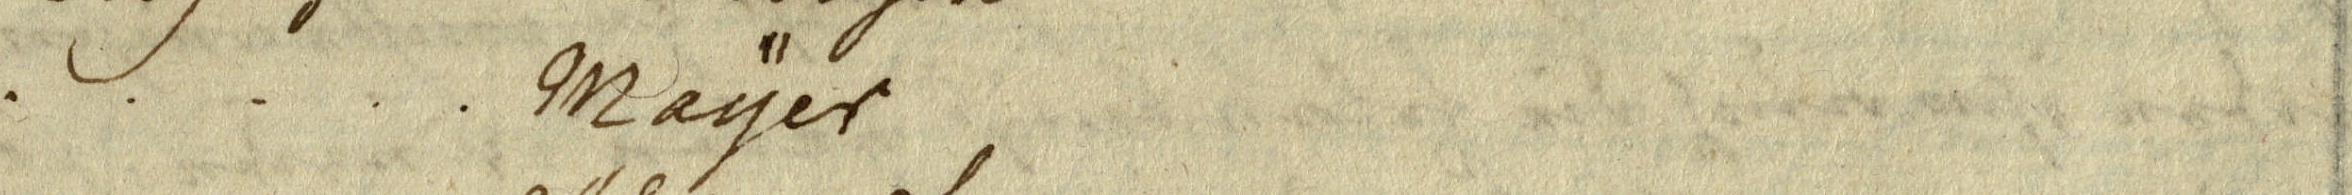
Maÿer
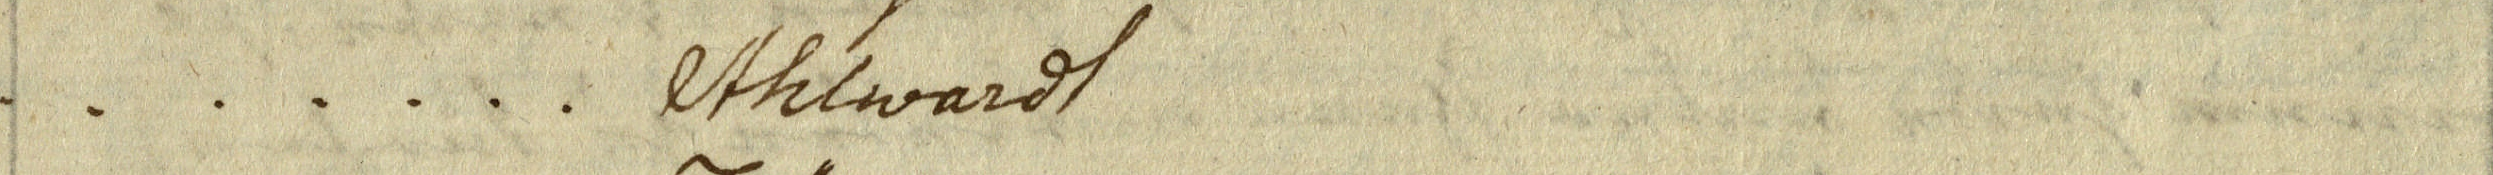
Ahlwardt
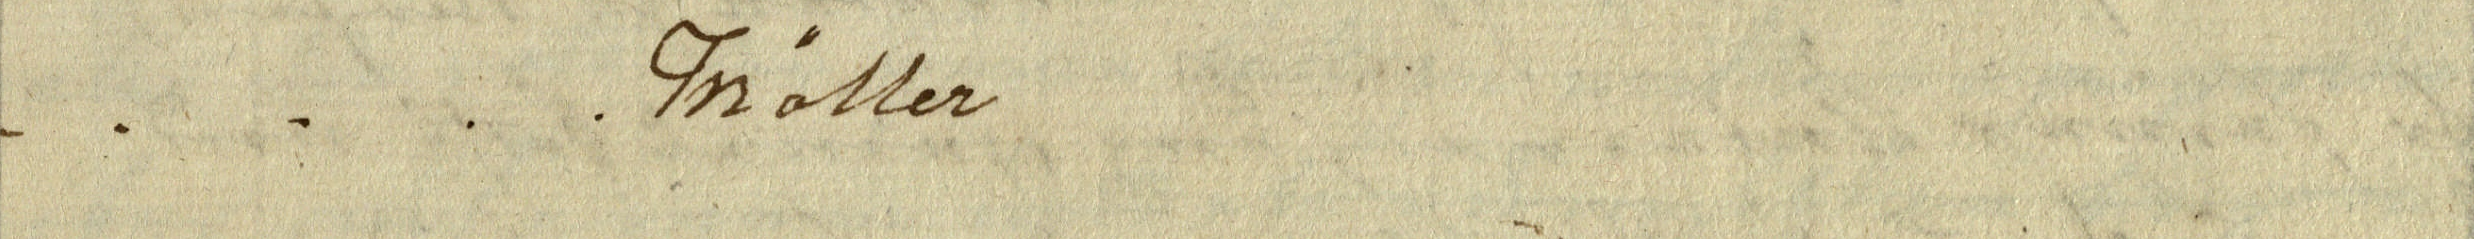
Möller
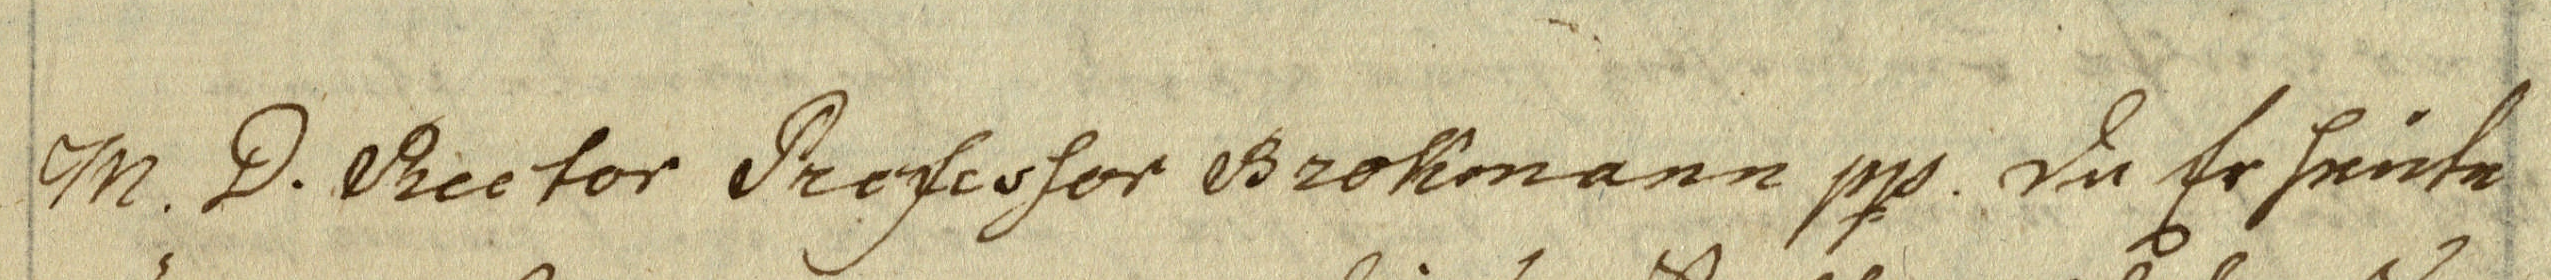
M. D. Rector Professor Brockmann pp. da Er heute
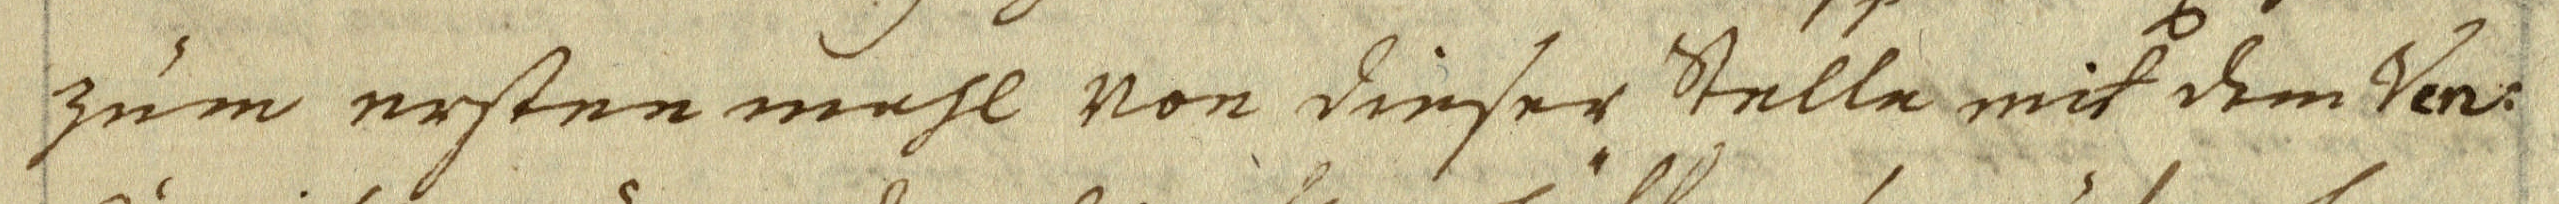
zum ersten mahl von dieser Stelle mit dem Ven.
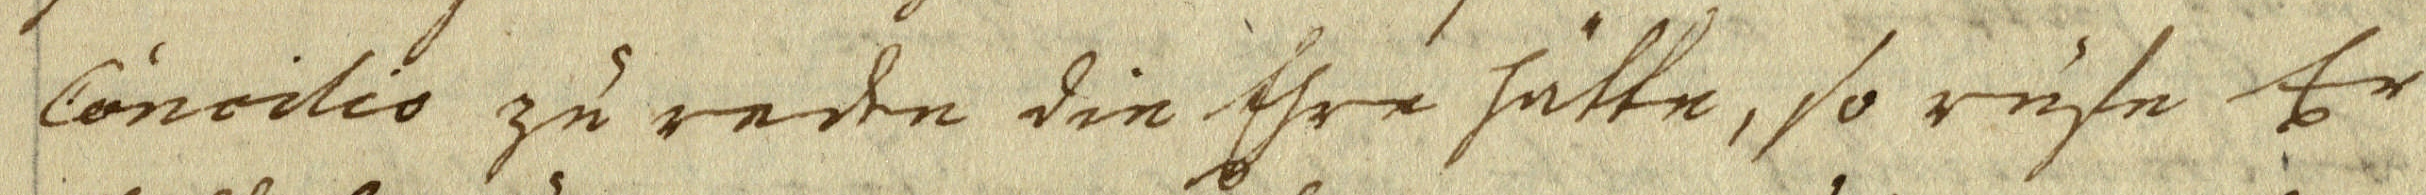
Concilio zu reden die Ehre hätte, so rufe Er
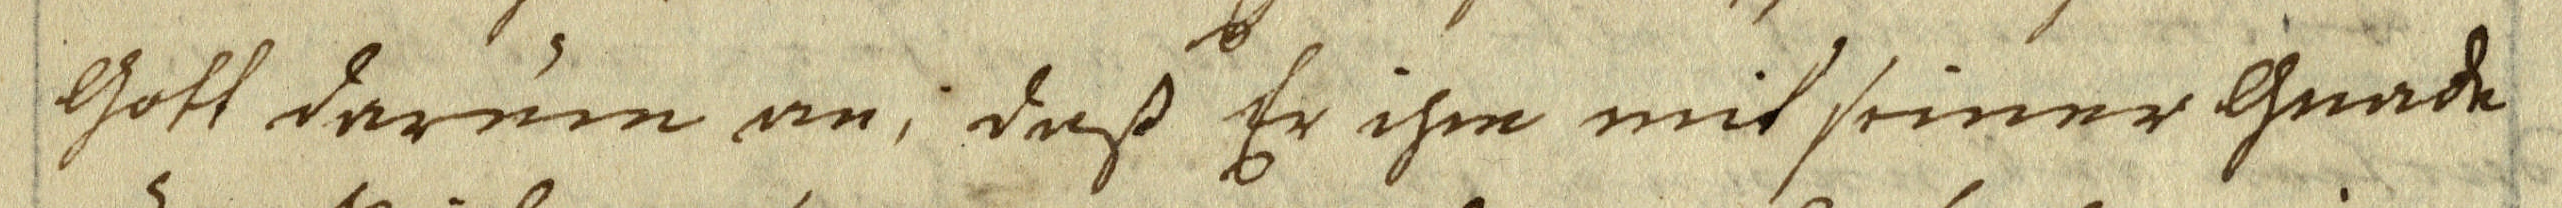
Gott darum an, daß Er ihm mit seiner Gnade
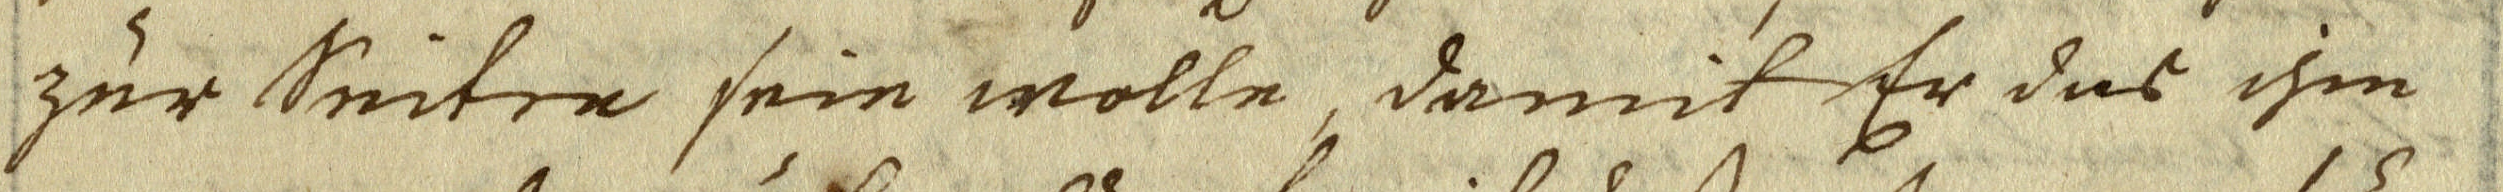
zur Seiten sein wolle, damit Er das ihm
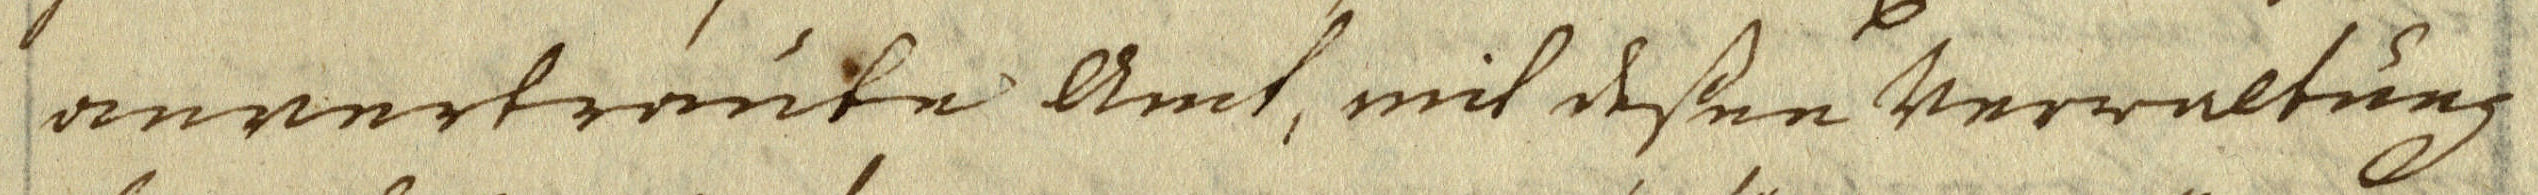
anvertraute Amt, mit deßen Verwaltung
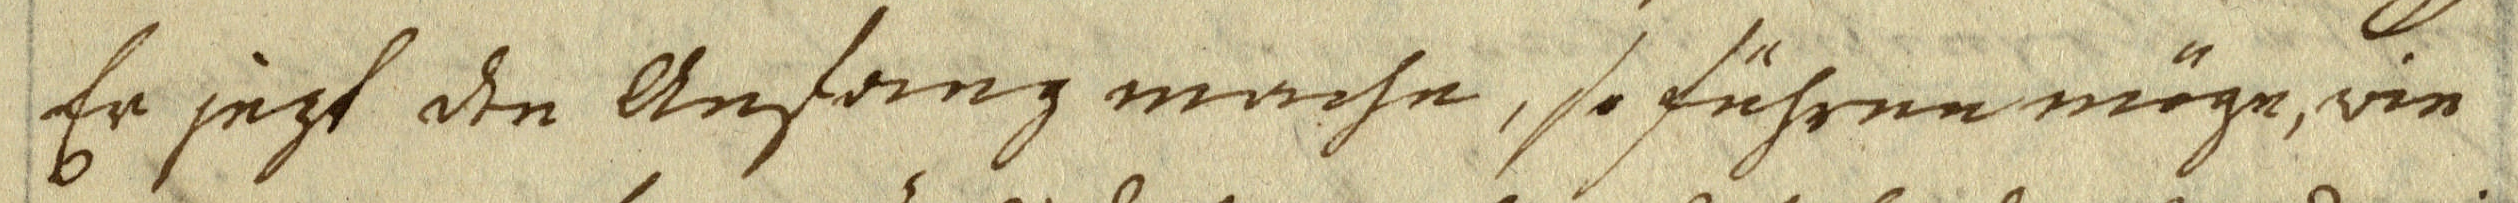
Er jezt den Anfang mache, so führen möge, wie
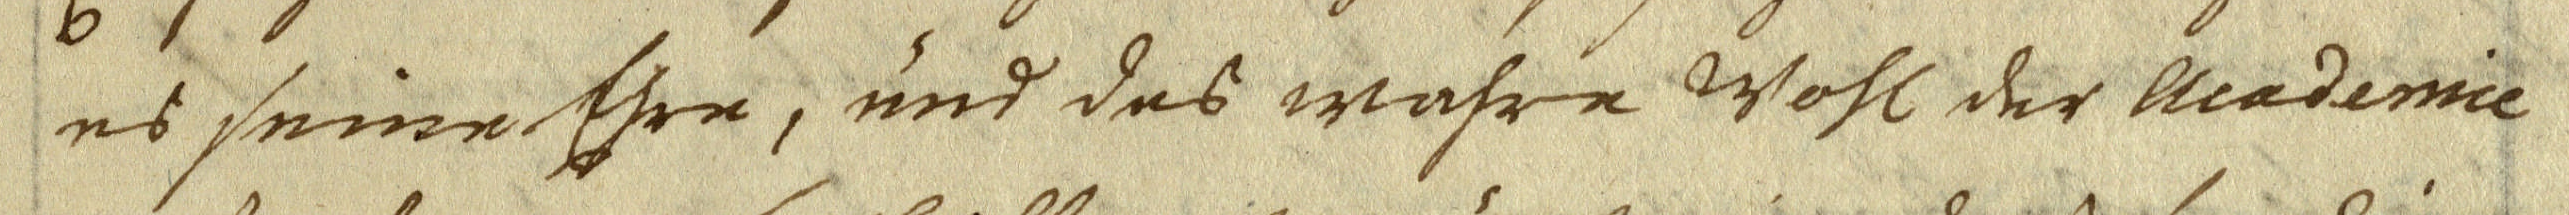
es seine Ehre, und das wahre Wohl der Academie
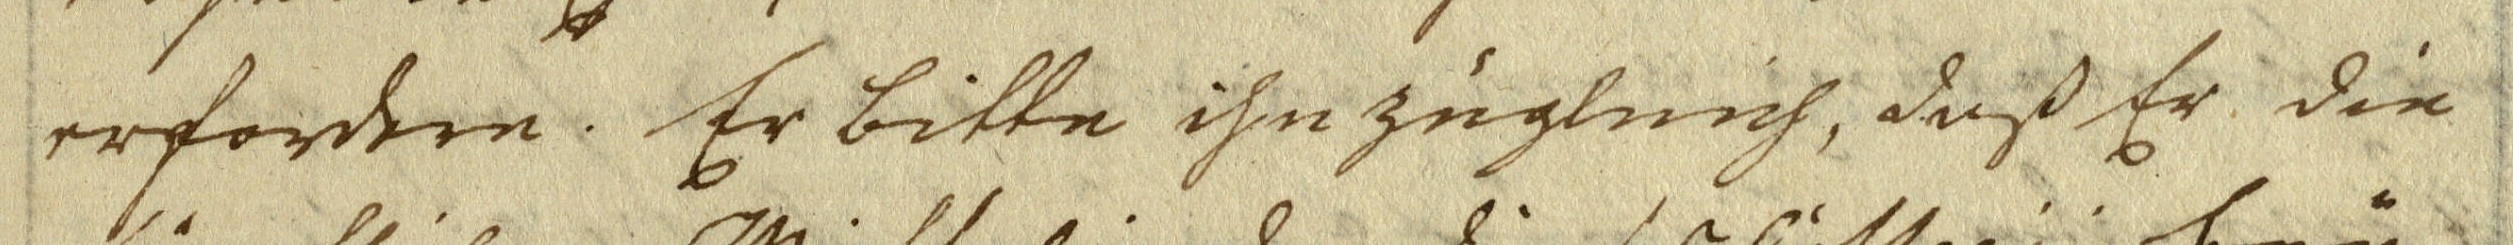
erfordere. Er bitte ihn zugleich, daß Er die
